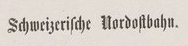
Schweizerische Nordostbahn.
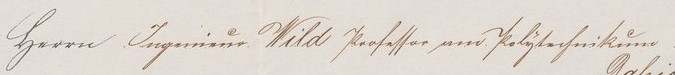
Herrn Ingenieur Wild Professor am Polytechnikum
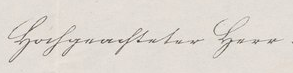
Hochgeachteter Herr!
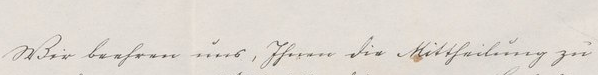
Wir beehren uns, Ihnen die Mittheilung zu
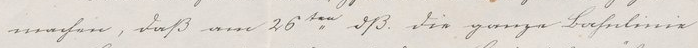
machen, daß am 26ten dß. die ganze Bahnlinie
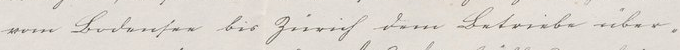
vom Bodensee bis Zürich dem Betriebe über-
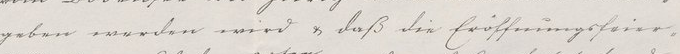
geben werden wird & daß die Eröffnungsfeier-
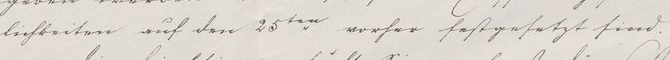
lichkeiten auf den 25ten vorher festgesetzt sind.
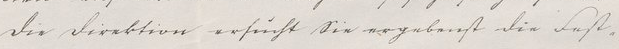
Die Direktion ersucht Sie ergebenst die Fest-
